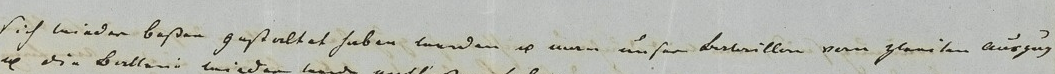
sich wieder beßer gestaltet haben werden u man unser Bataillon vom zweiten Auszug
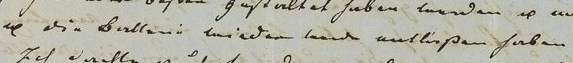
u die Batterie wieder werde entlaßen haben.
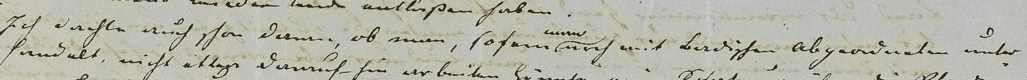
Ich dachte auch schon daran, ob man, sofern man noch mit Badischen Abgeordneten unter-
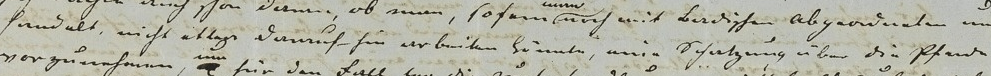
handelt, nicht etwa darauf-hin arbeiten könnte, eine Schätzung über die Pferde
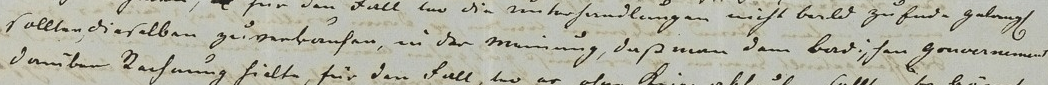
sollten, dieselben zu verkaufen in der Meinung, daß man dem badischen Gouverneuement
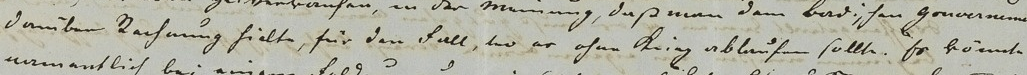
darüber Rechnung hielte, für den Fall, wo es ohne Krieg ablaufen sollte. Es könnte
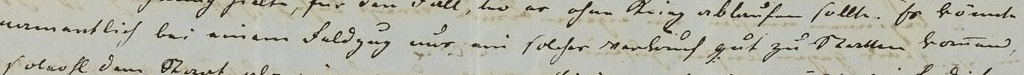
namentlich bei einem Feldzug uns ein solcher Verkauf gut zu Statten kommen,
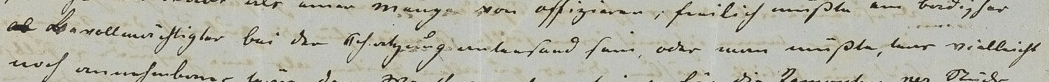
ob Bevollmächtigter bei der Schatzung anwesend sein, oder man müßte, was vielleicht
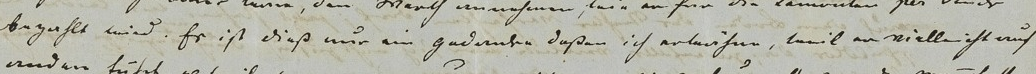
bezahlt wird. Es ist dieß nur ein Gedanke deßen ich erwähne, weil er vielleicht auf
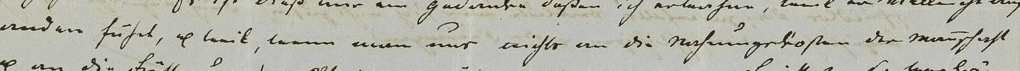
andere führt, u weil, wenn man uns nichts an die Nahrungskosten der Mannschaft u
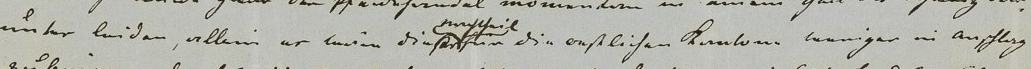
unter leiden, allein es wäre dieser Nachtheil für die oestlichen Kantone weniger in Anschlag
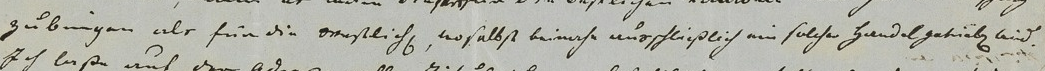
zu bringen als für die westlichen, wo selbst beinahe ausschließlich ein solcher Handel getrieben wird.
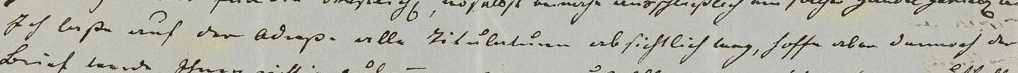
Ich laße auf der Adreße alle Titulaturen absichtlich weg, hoffe aber dennoch der
